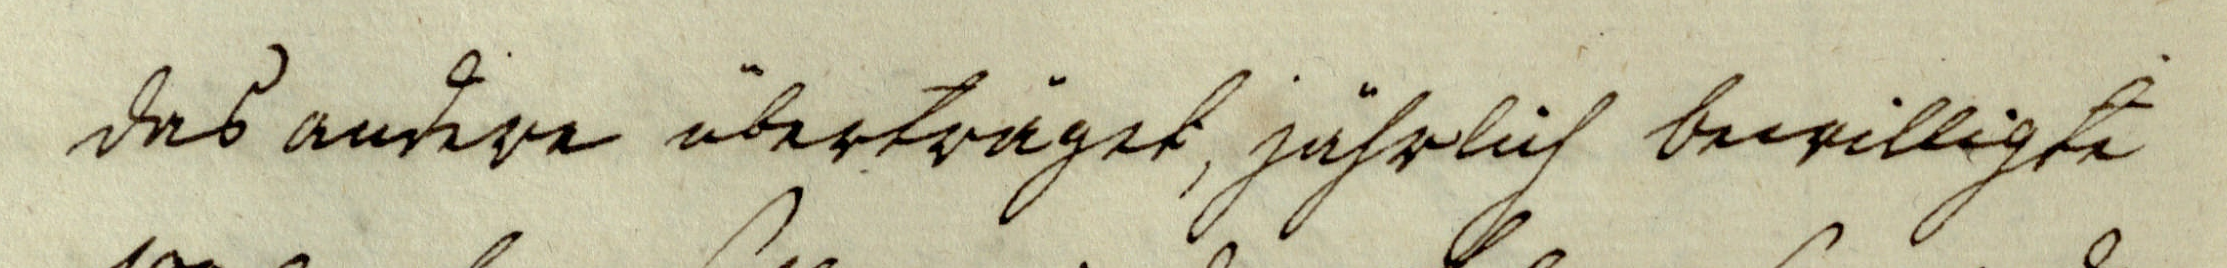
das andere überträget, jährlich bewilligte
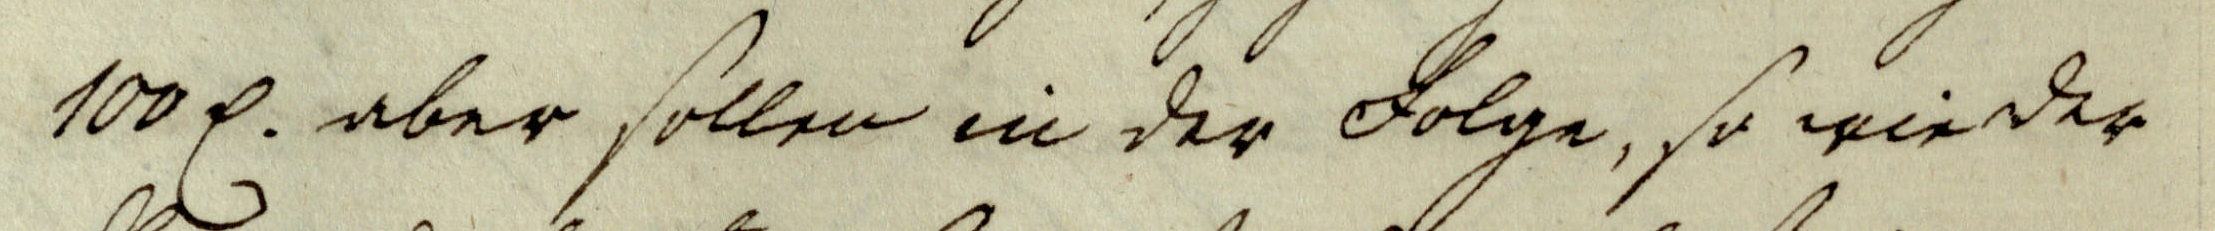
100 l. aber sollen in der Folge, so wie der
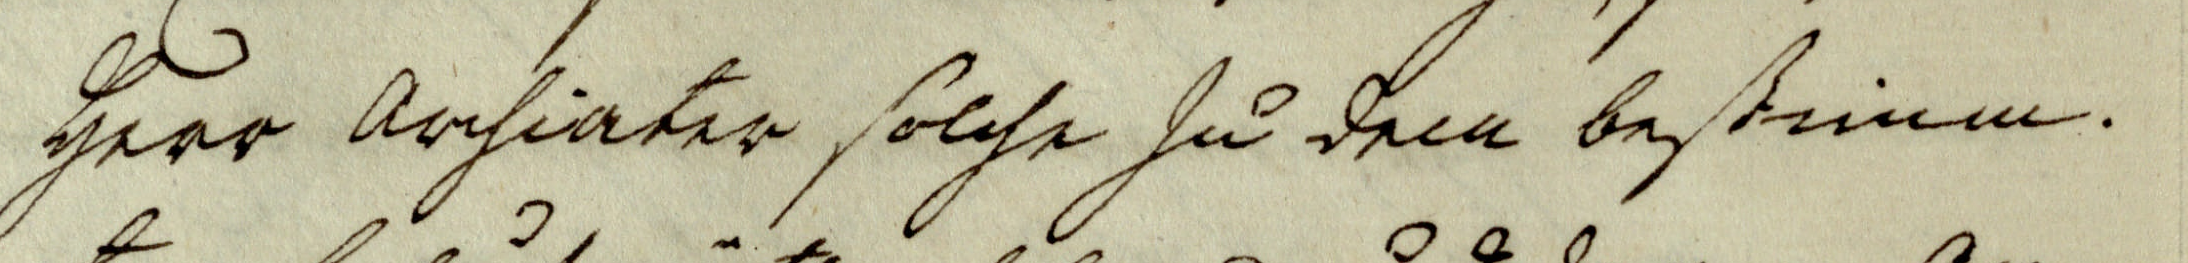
Herr Archiater solche zu dem bestimm¬
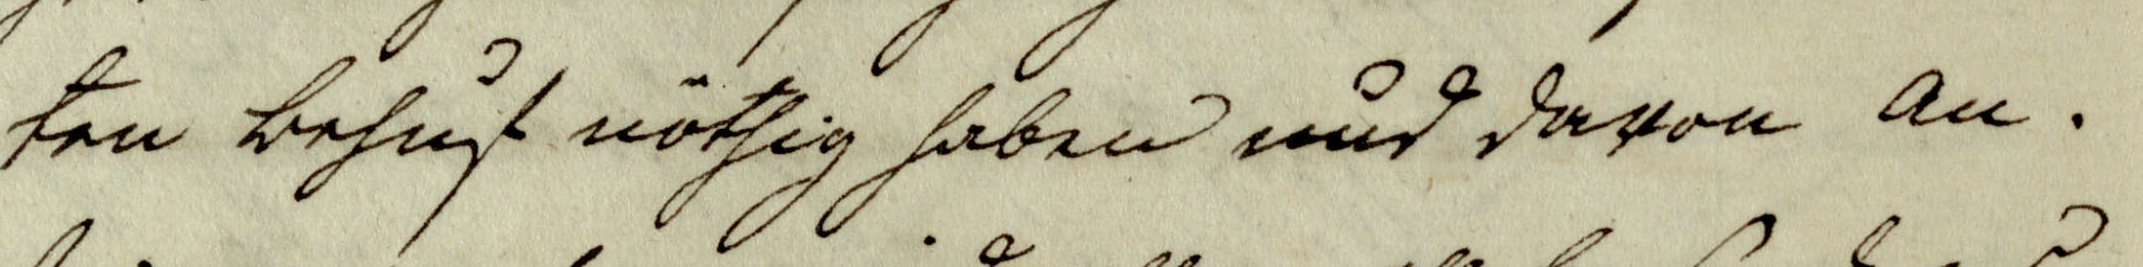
ten Behuf nöthig haben und davon An¬
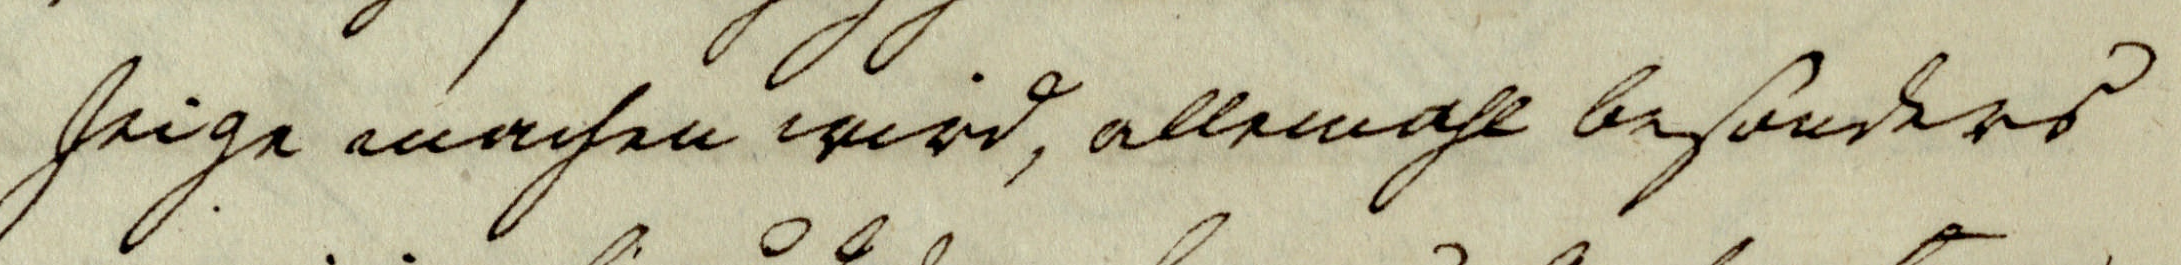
zeige machen wird, allemahl besonders
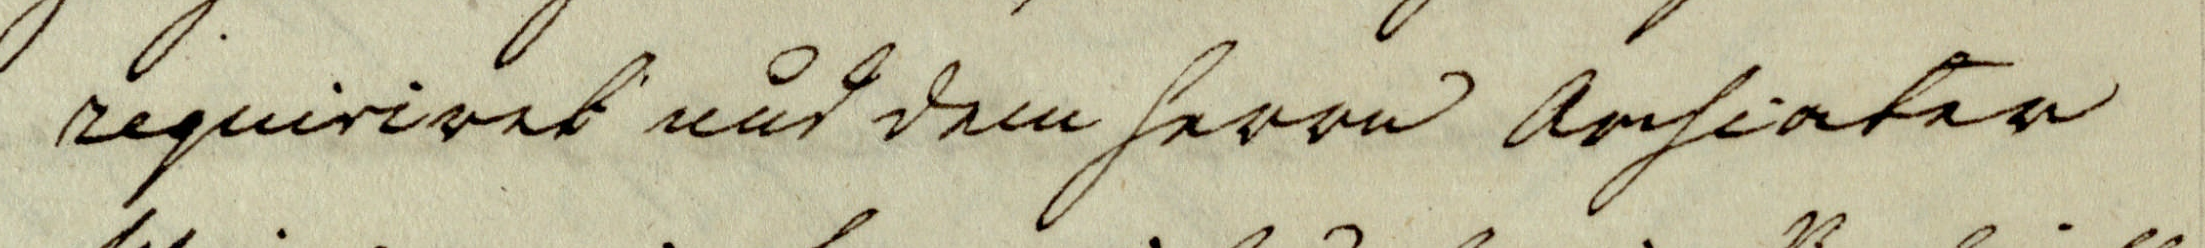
requiriret und dem Herrn Archiater
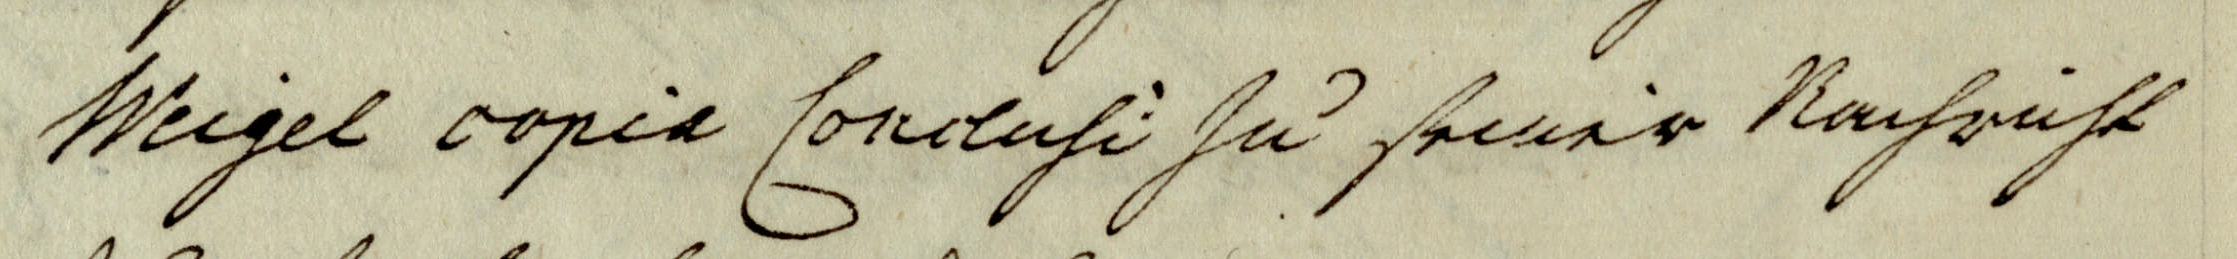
Weigel copia Conclusi zu seiner Nachricht
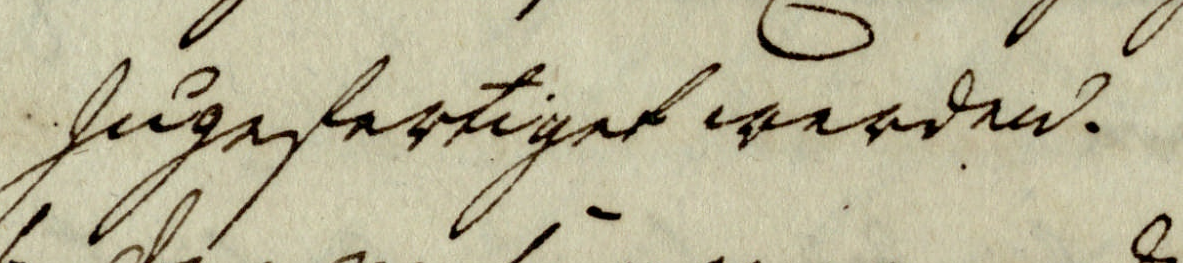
zugefertiget werden.
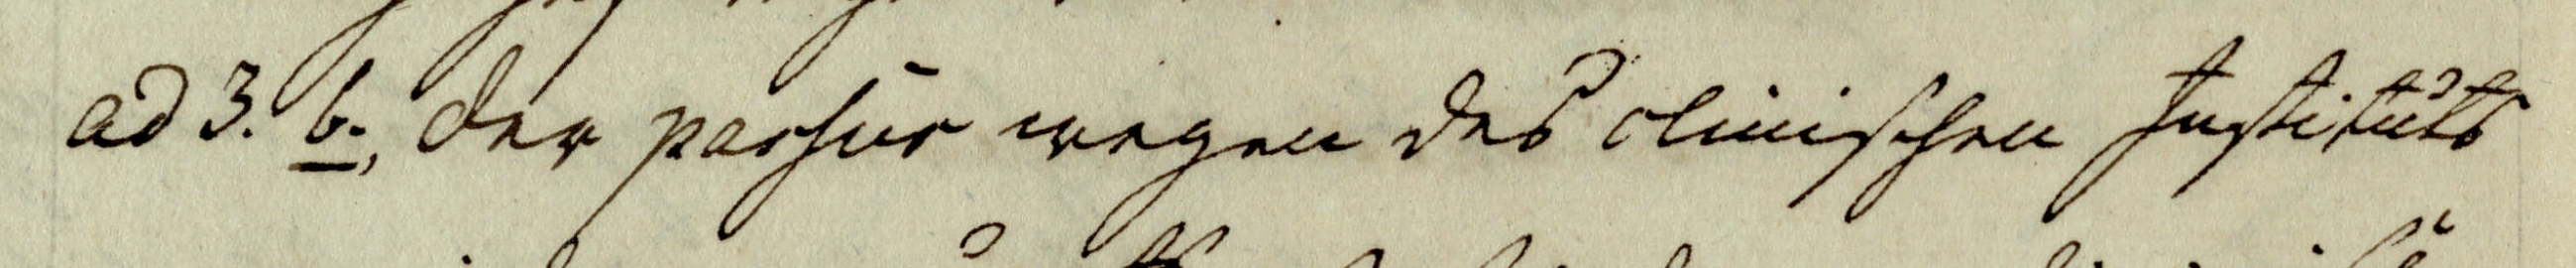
ad 3.b., der passus wegen des clinischen Instituts
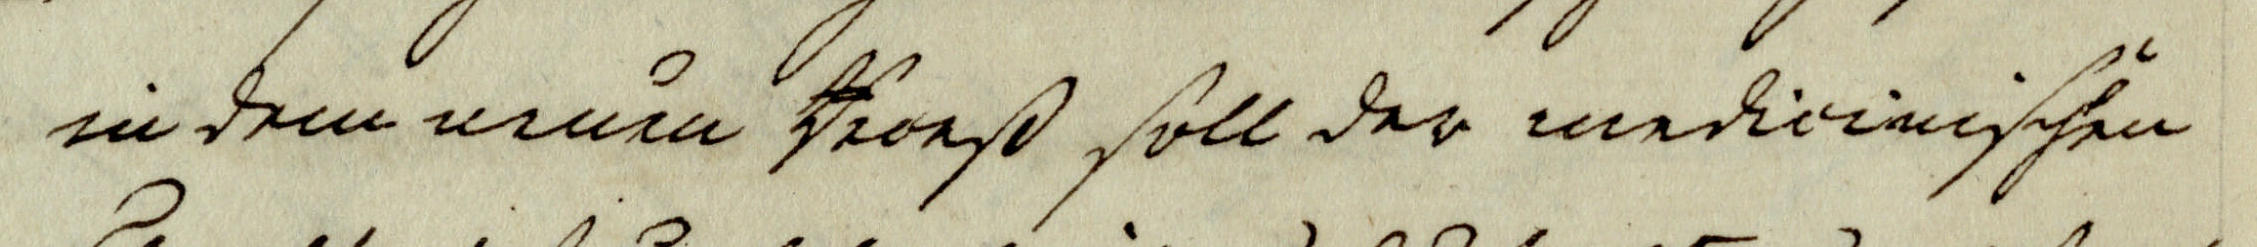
in dem neuen Receß soll der medicinischen
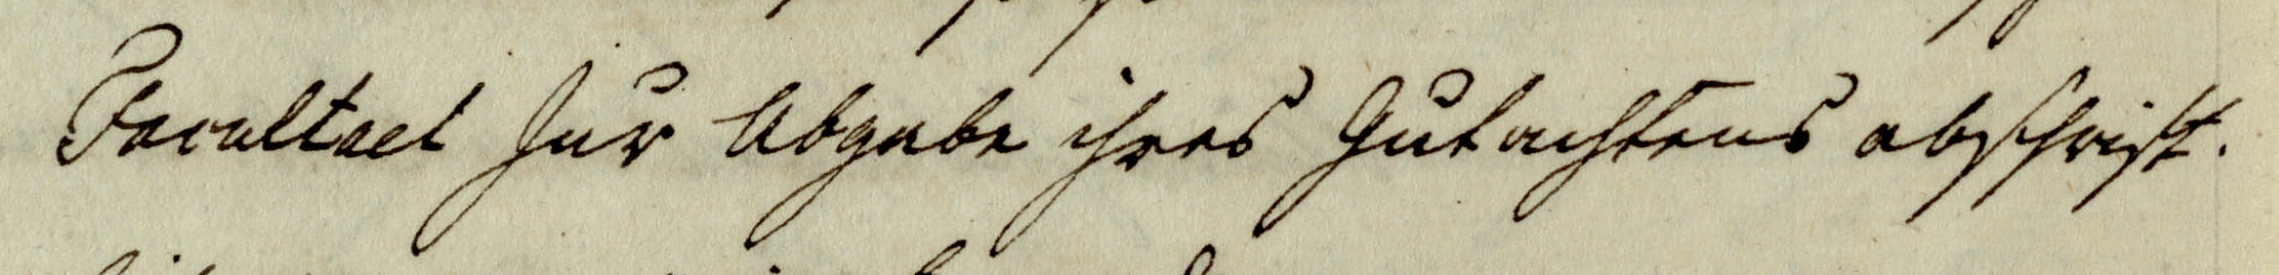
Facultaet zur Abgabe ihres Gutachtens abschrift¬
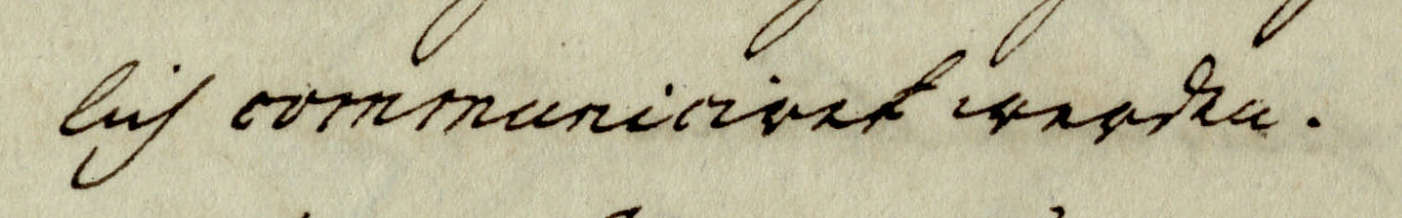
lich communiciret werden.
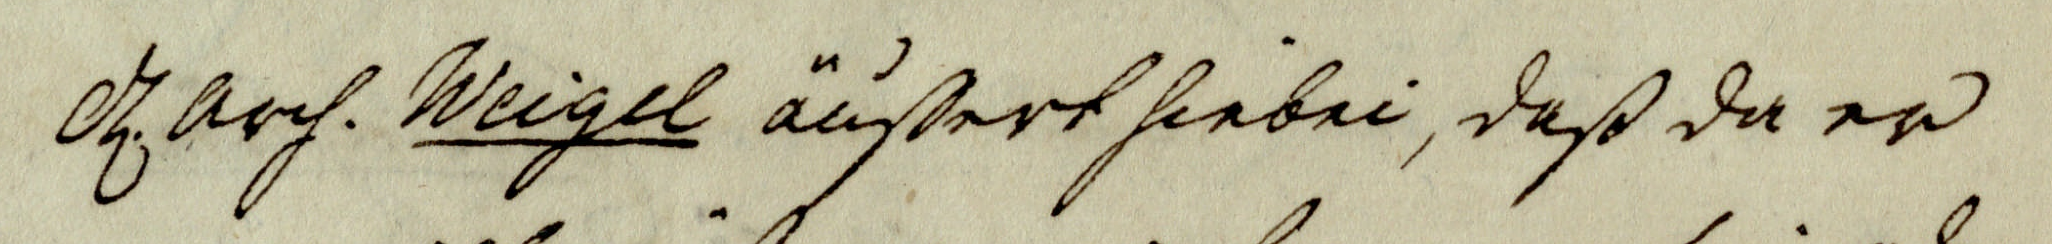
dh. Prof. Weigel äussert hiebei, daß da er
